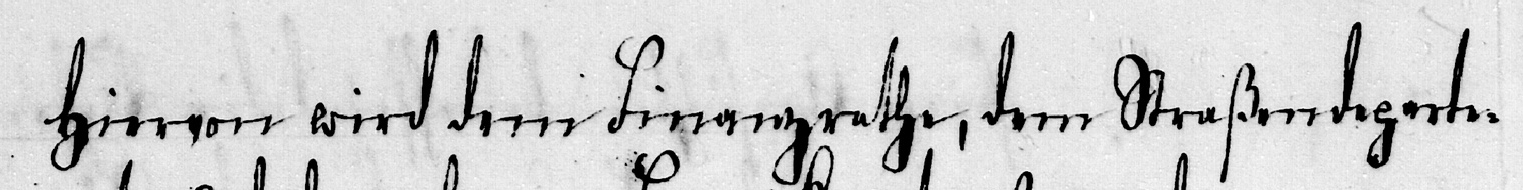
Hiervon wird dem Finanzrathe, dem Straßendeparte¬
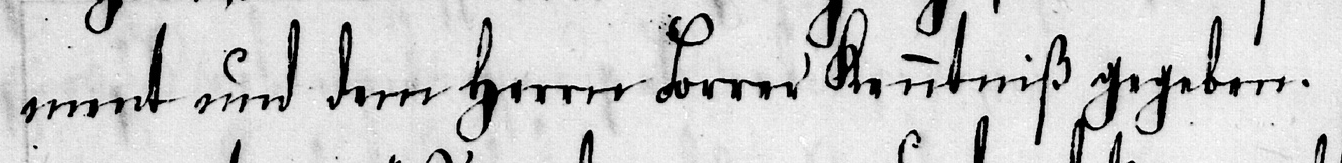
ment und dem Herrn Forrer Kenntniß gegeben.
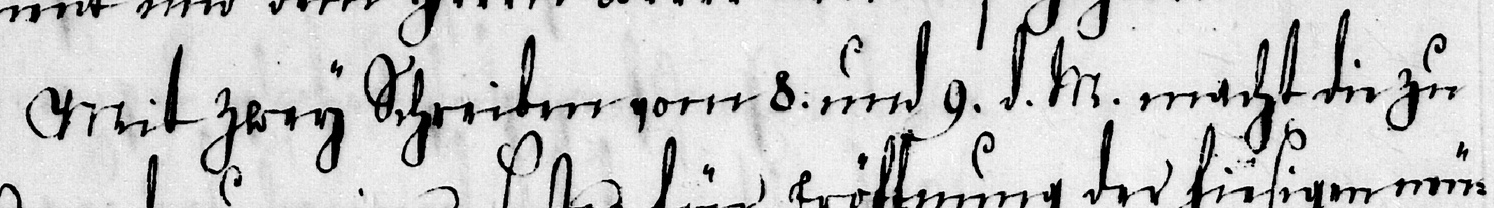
Mit zwey Schreiben vom 8. und 9. d. M. macht die zu
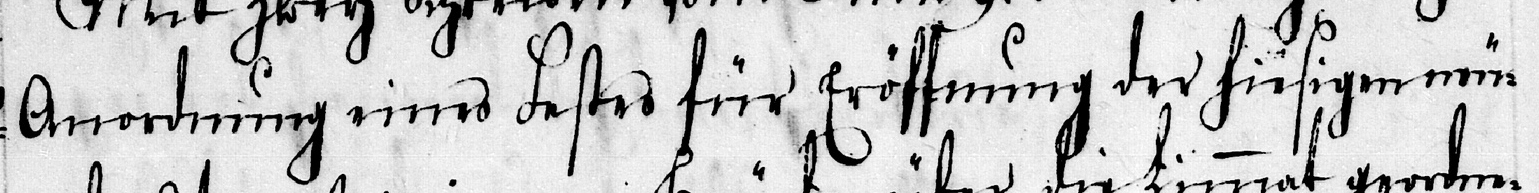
Anordnung eines Festes für Eröffnung der hiesigen neu¬
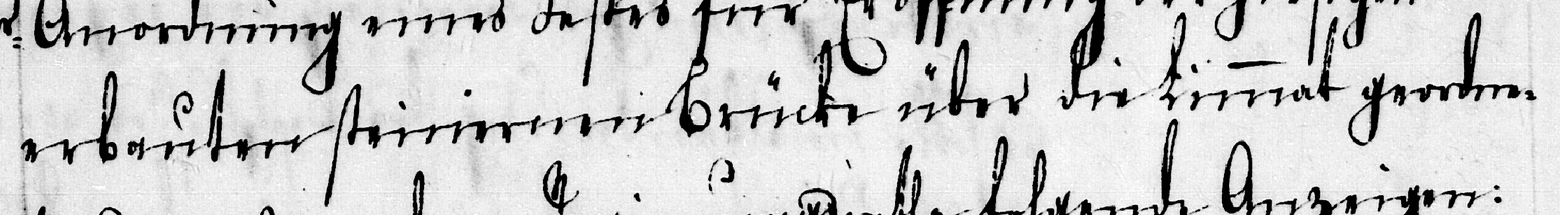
erbauten steinernen Brücke über die Limmat geordne¬
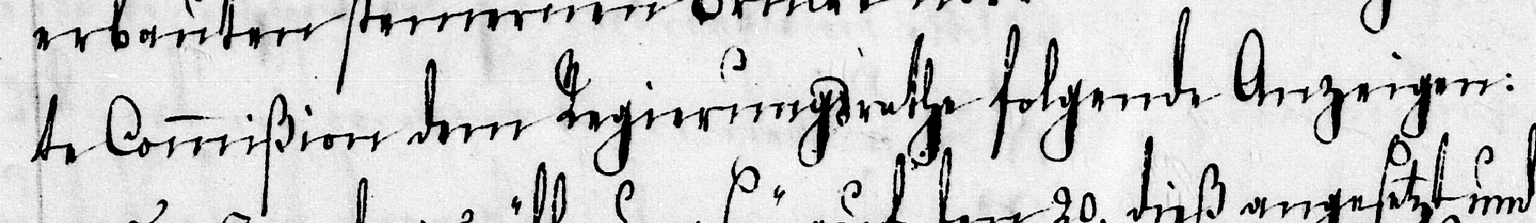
te Commißion dem Regierungsrathe folgende Anzeigen:
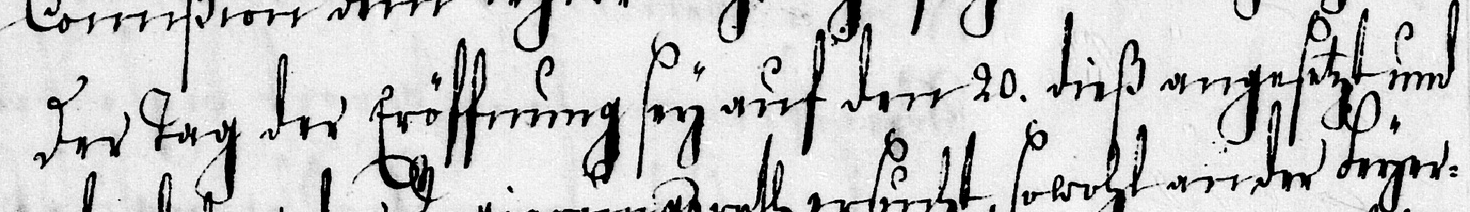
Der Tag der Eröffnung sey auf den 20. dieß angesetzt und
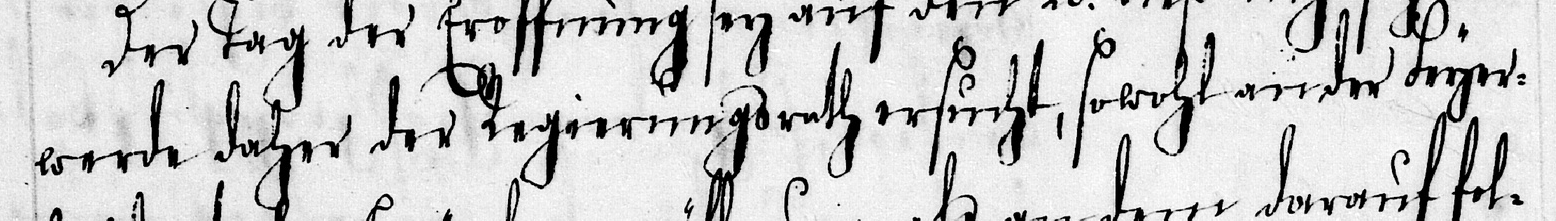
werde daher der Regierungsrath ersucht, sowohl an der Feyer¬
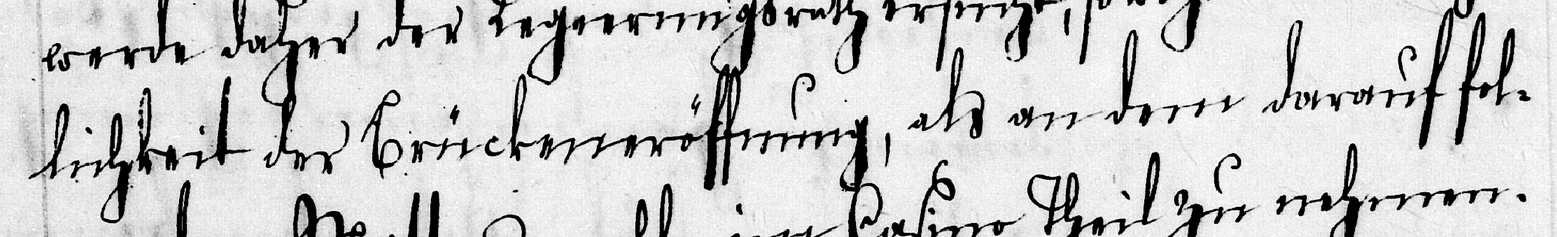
lichkeit der Brückeneröffnung, als an dem darauf fol¬
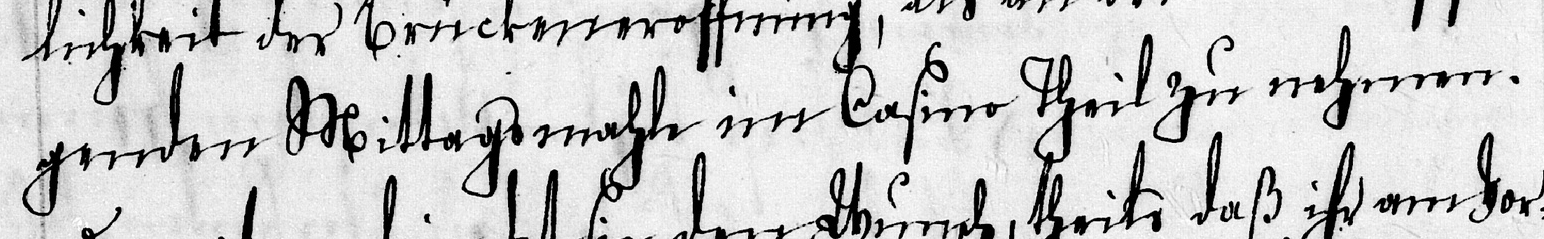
genden Mittagsmahle im Casino Theil zu nehmen.
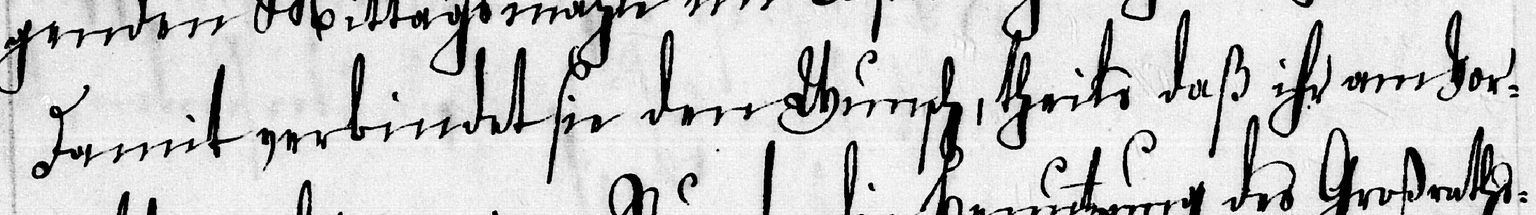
Damit verbindet sie den Wunsch, theils daß ihr am Vor¬
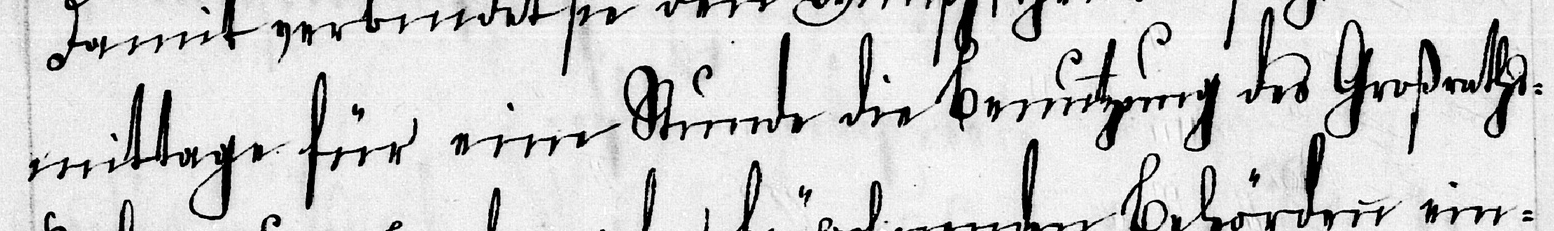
mittage für eine Stunde die Benutzung des Großraths¬
